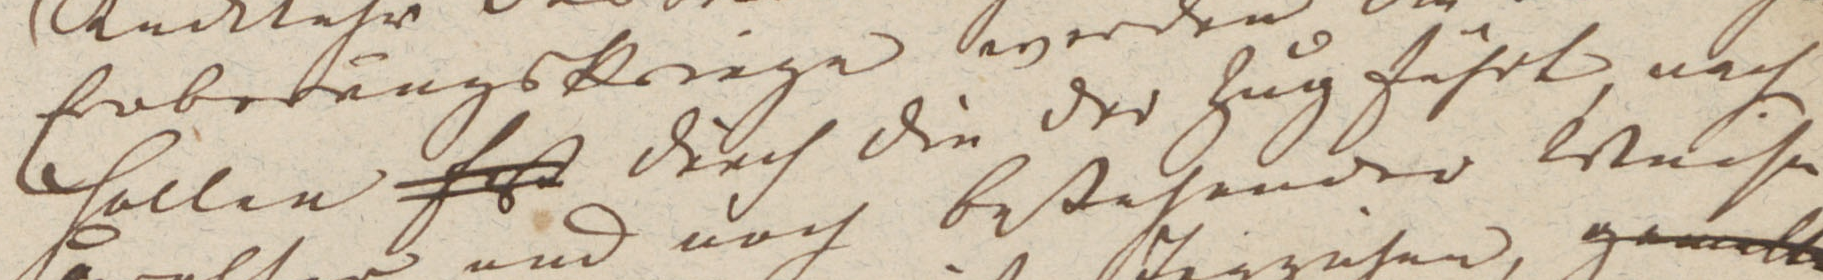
Hallen fast durch die der Zug führt, nach
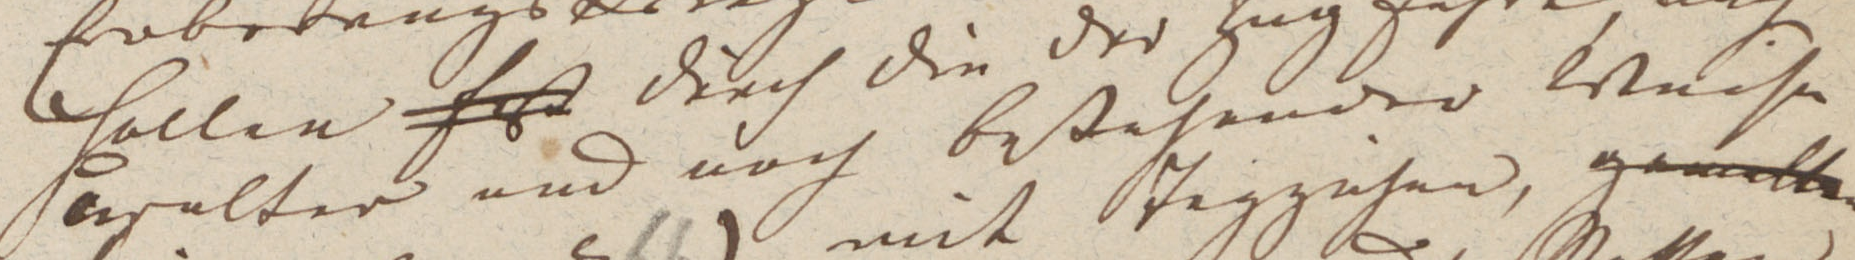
uralter und noch bestehender Weise
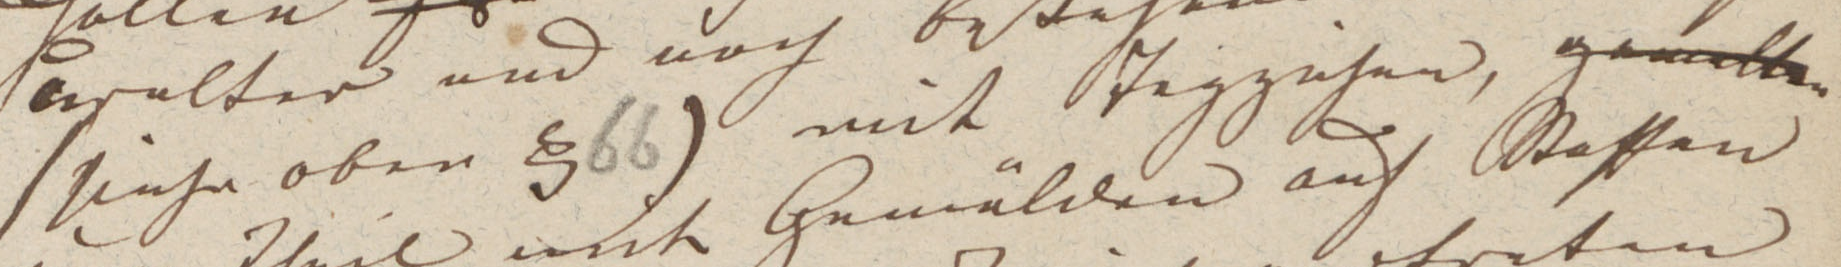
(siehe oben § 66) mit Teppichen, gemalten
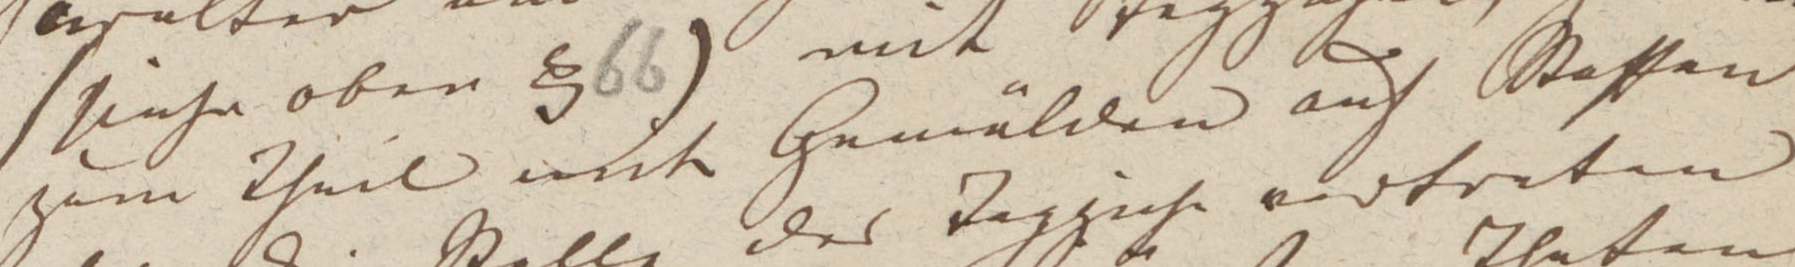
zum Theil mit Gemälden auf Stoffen
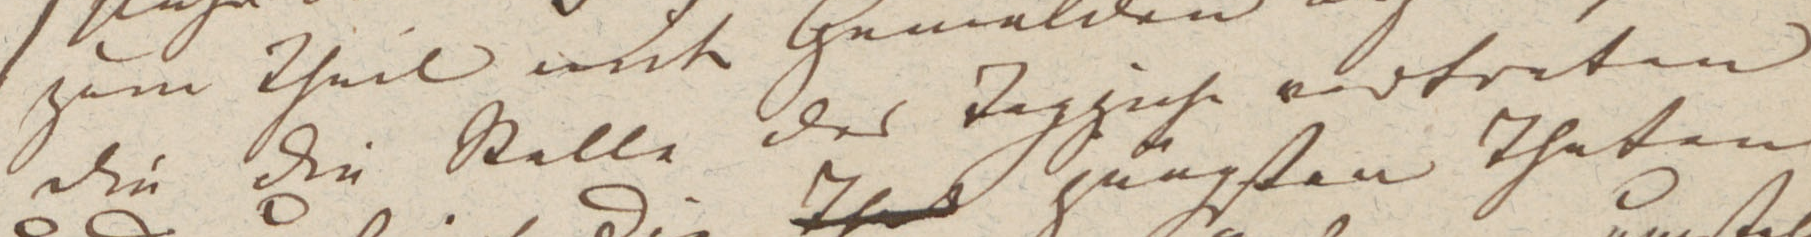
die die Stelle der Teppiche vertreten
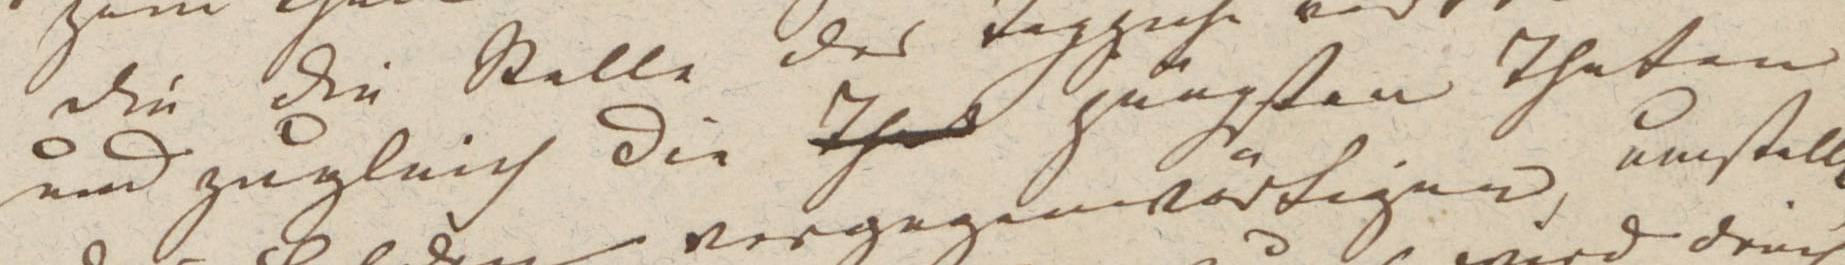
und zugleich die That jüngsten Thaten
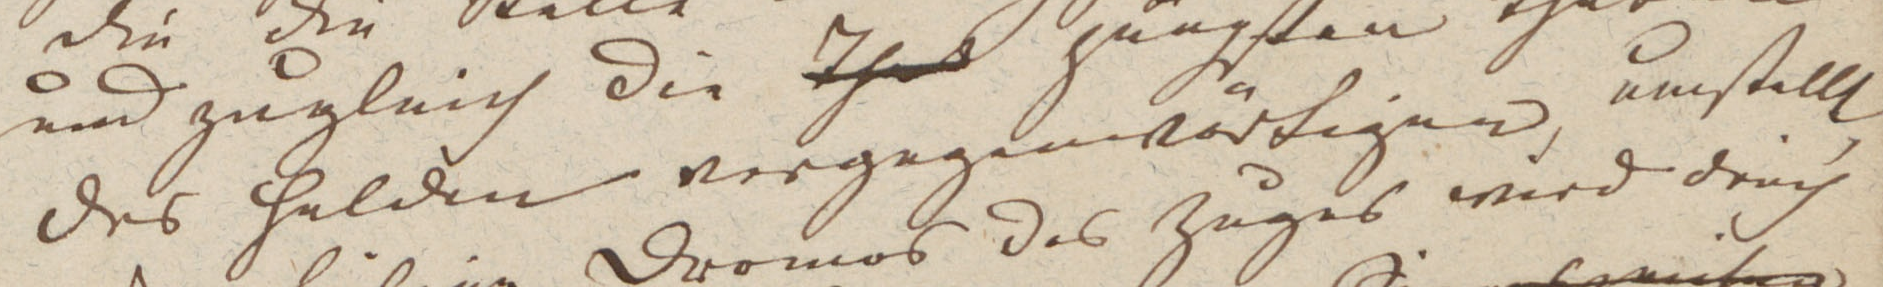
des Helden vergegenwärtigen, umstellt
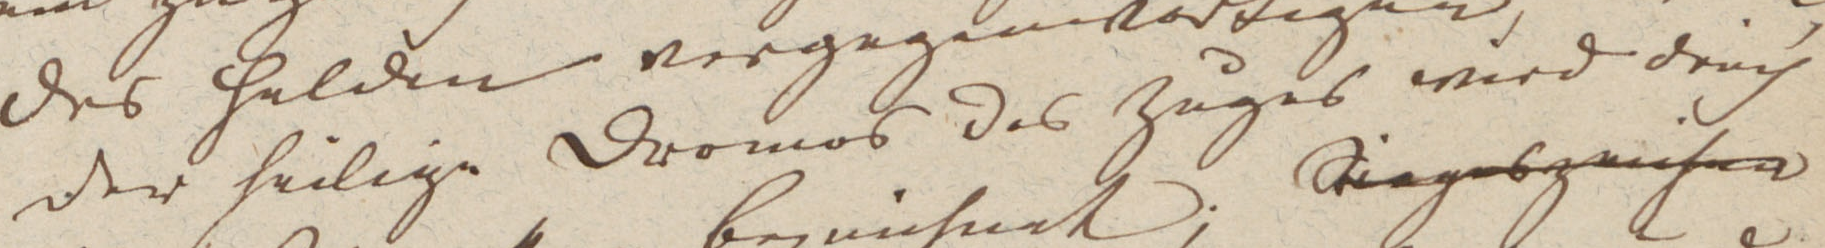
der heilige Dromos des Zuges wird durch
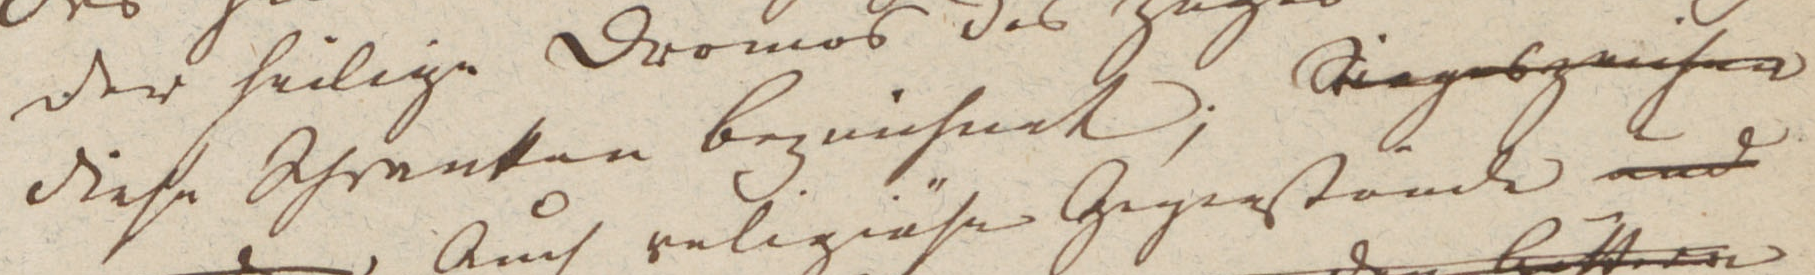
diese Schranken bezeichnet; Siegeszeichen
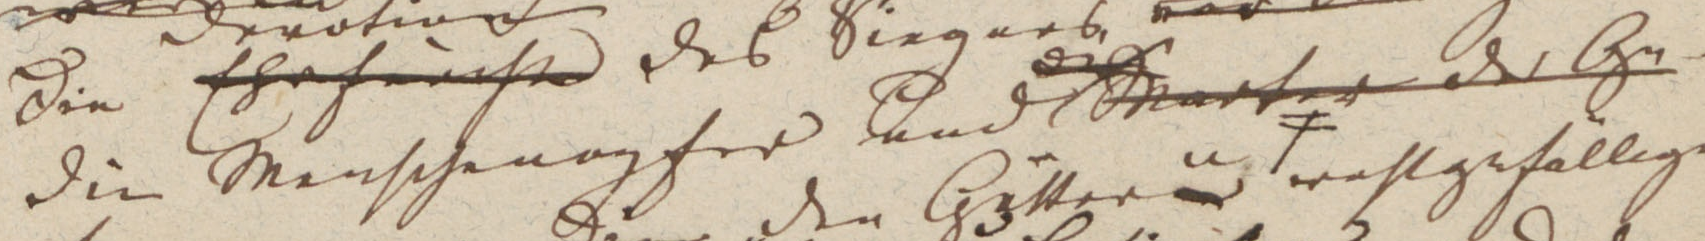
die Menschenopfer und die Marter der Ge-
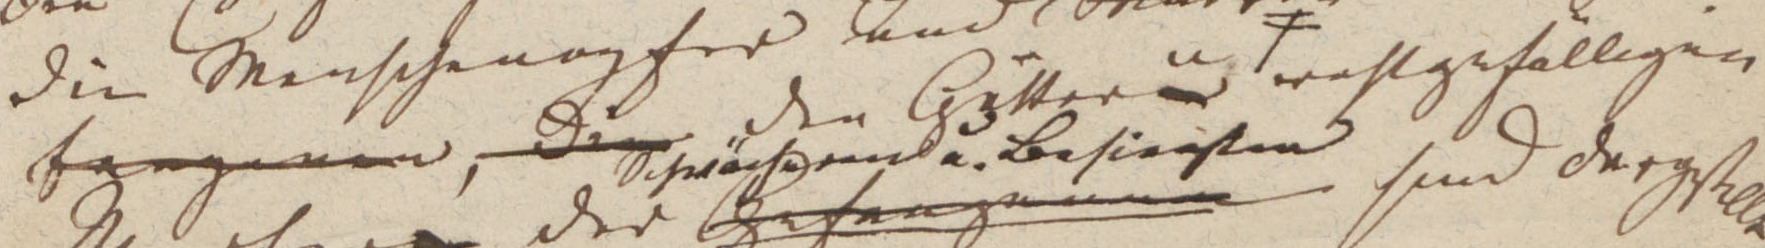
fangenen, die den Göttern % wohlgefälligen
